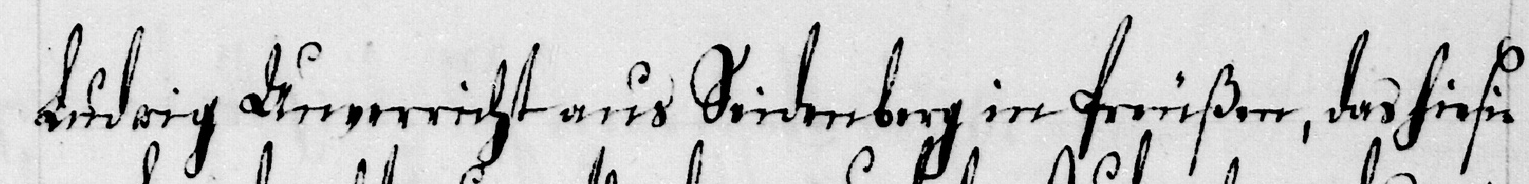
Ludwig Unverricht aus Seidenberg in Preußen, das hiesi¬
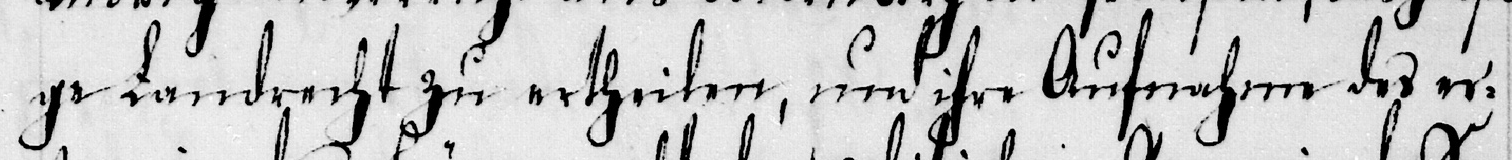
ge Landrecht zu ertheilen, und ihre Aufnahme des er¬
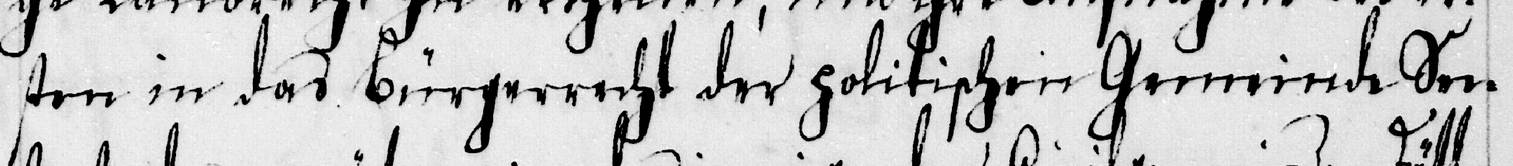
sten in das Bürgerrecht der politischen Gemeinde See¬
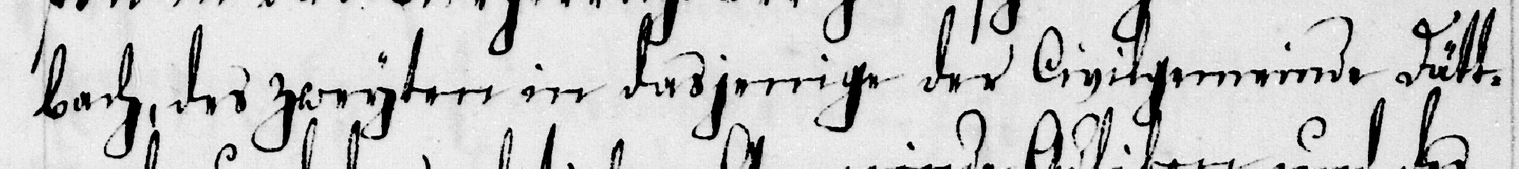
bach, des zweyten in dasjenige der Civilgemeinde Dätt¬
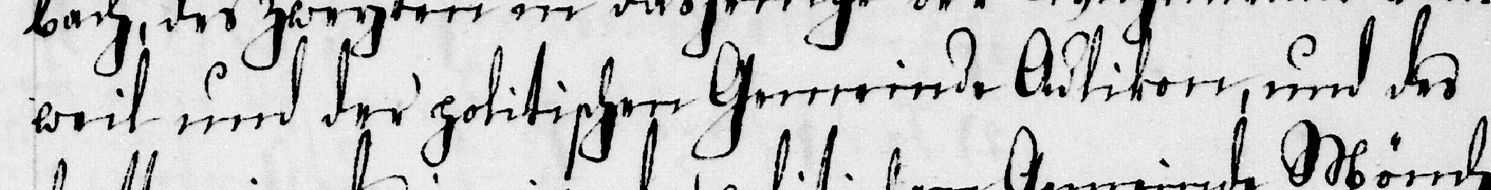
weil und der politischen Gemeinde Adlikon, und des
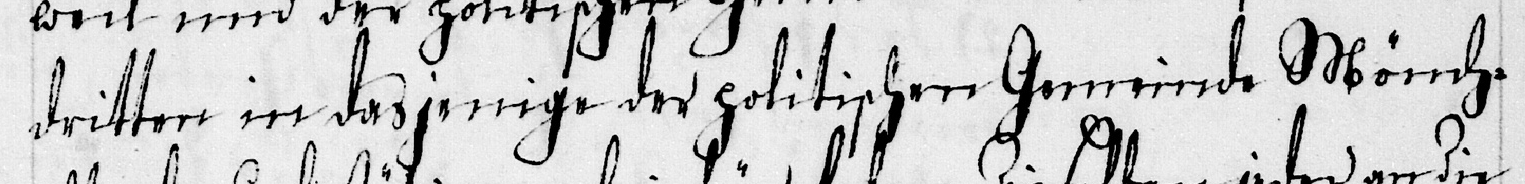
dritten in dasjenige der politischen Gemeinde Mönch¬
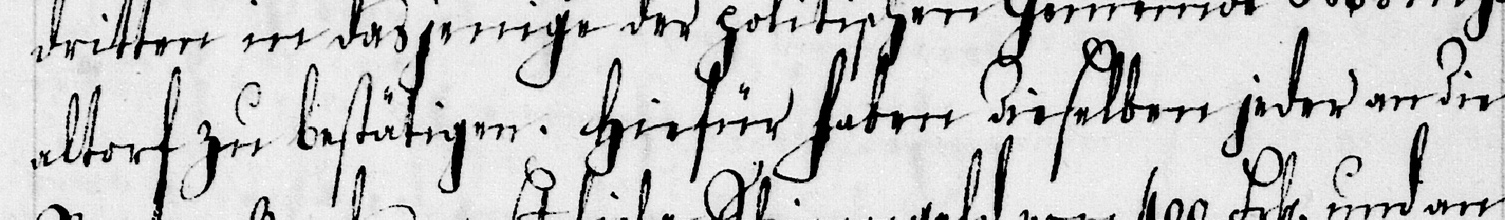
altorf zu bestätigen. Hiefür haben dieselben jeder an die
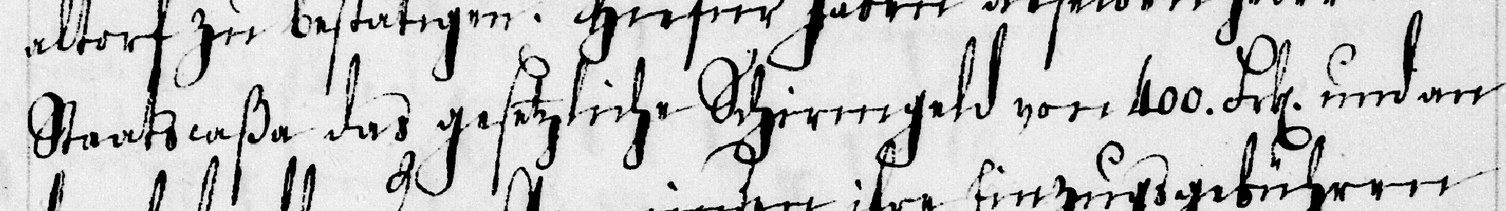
Staatscaßa das gesetzliche Schirmgeld von 400. Frk[en]. und
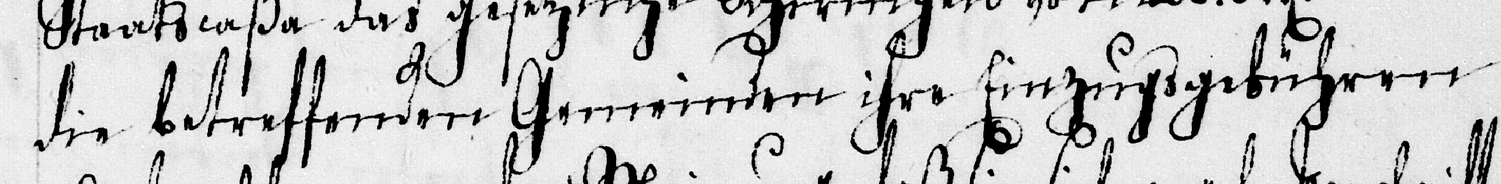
die betreffenden Gemeinden ihre Einzugsgebühren
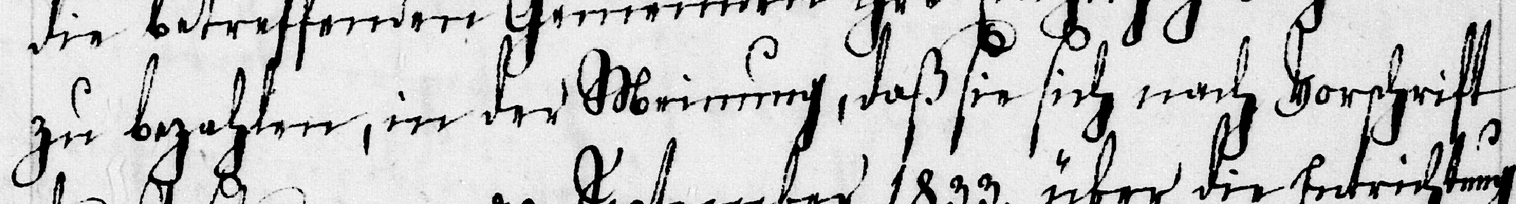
zu bezahlen, in der Meinung, daß sie sich nach Vorschrift
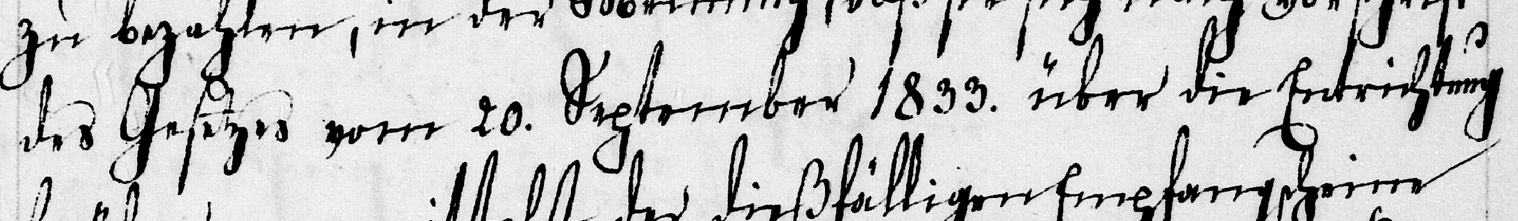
des Gesetzes vom 20. September 1833. über die Entrichtung
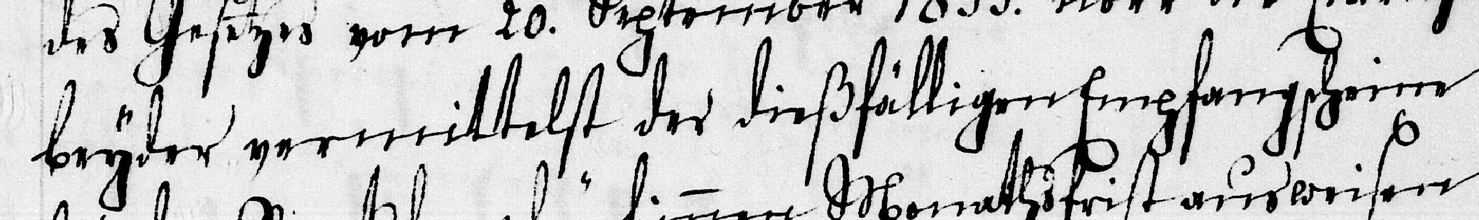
beyder vermittelst der dießfälligen Empfangscheine
